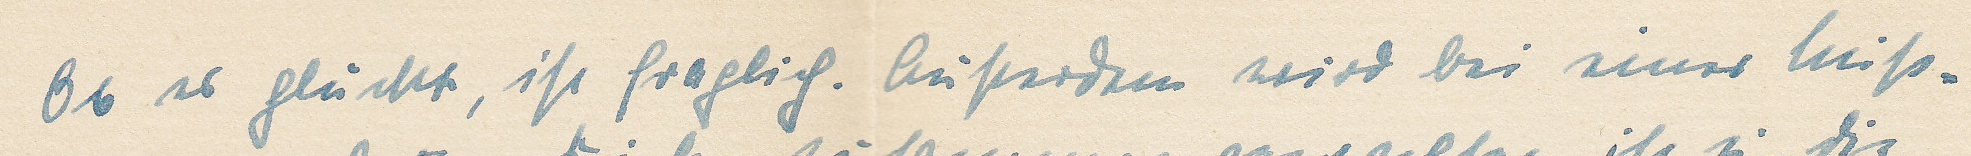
Ob es glückt, ist fraglich. Außerdem wird bei einer Steiß-
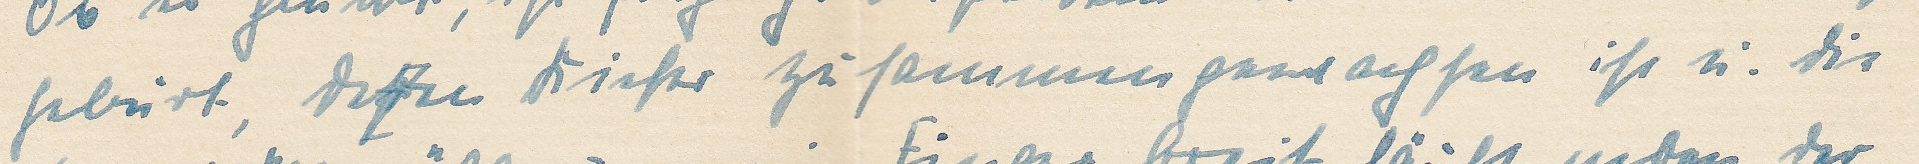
geburt, dazu Kiefer zusammengewachsen ist u. die
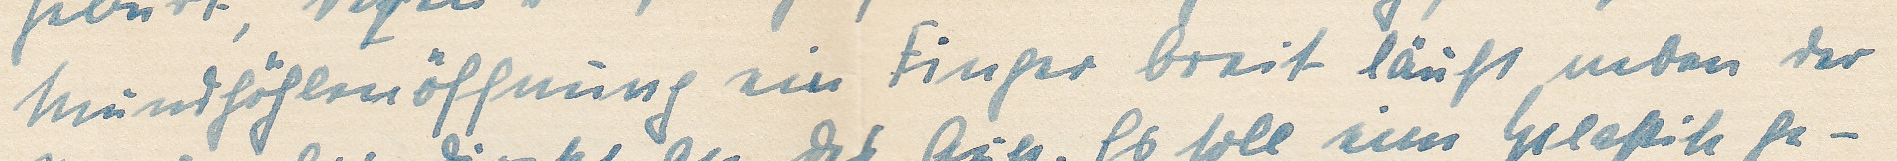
Mundhöhlenöffnung ein Finger breit läust neben der
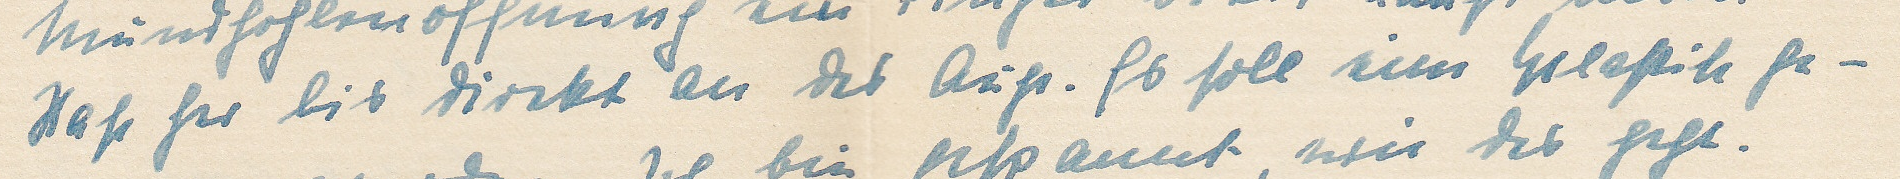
Nase her bis direkt an das Auge So soll eine Plastik ge-
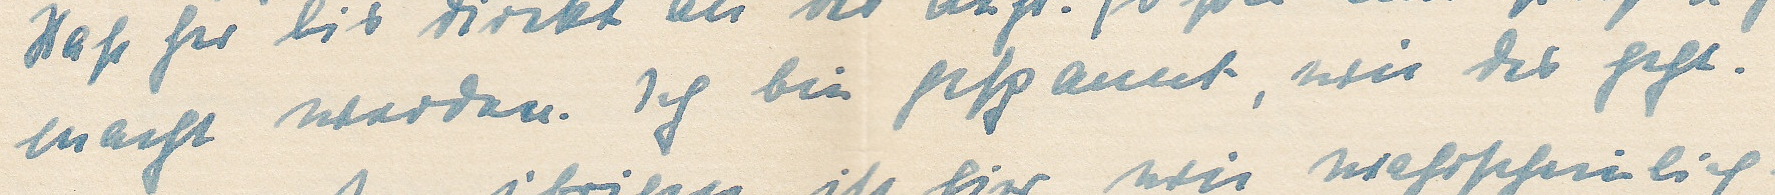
macht werden. Ich bin gespannt, wie das geht.
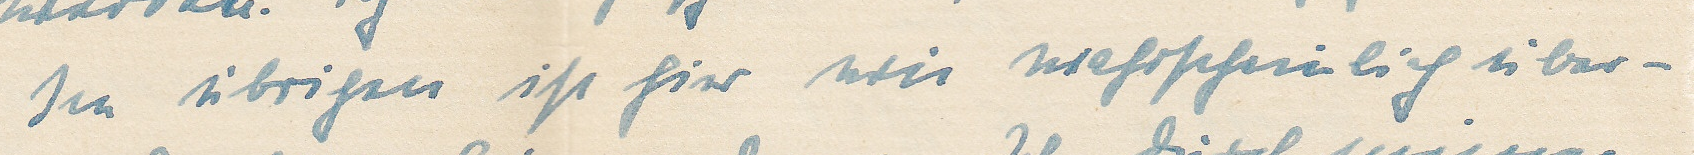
Im übrigen ist hier wie wahrscheinlich über-
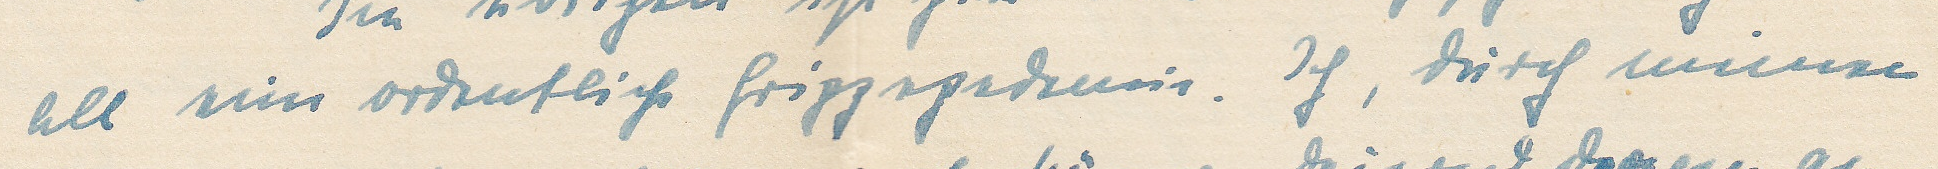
all ein ordentliche Grippepandemie. Ich, durch meine
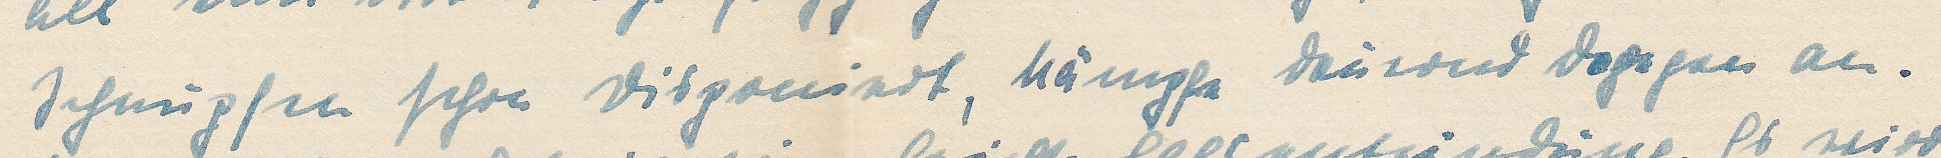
Schnupfen schon disponiert, kämpfe dauernd dagegen an.
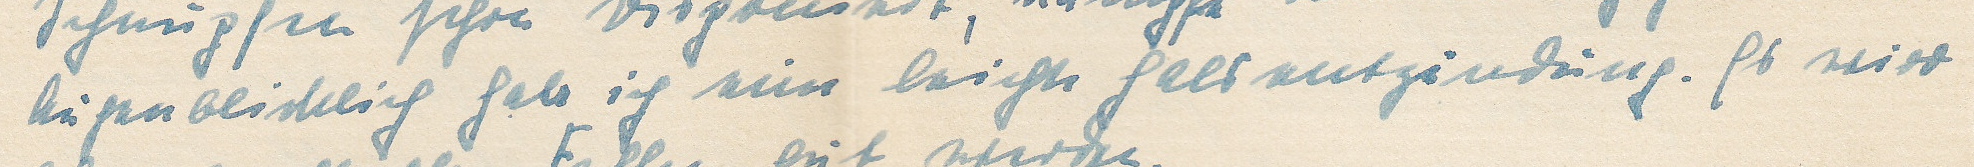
Augenblicklich habe ich eine leichte Halsentzündnung. Es wird
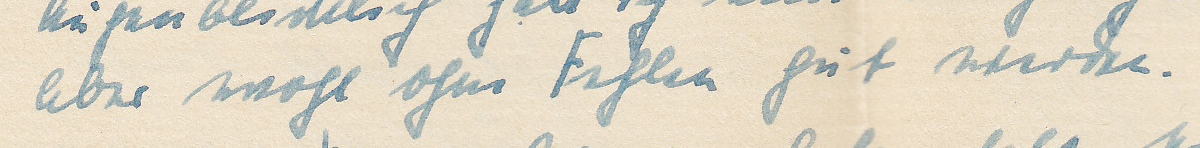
aber wohl ohne Fehlen gut werden.
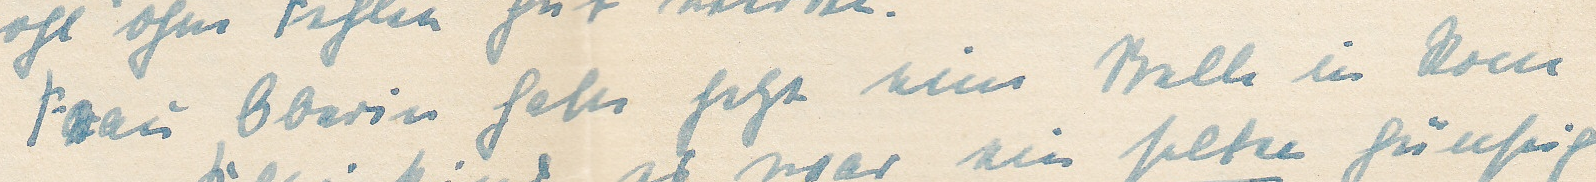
Frau Oberin hat jetzt eine Stelle im Raum
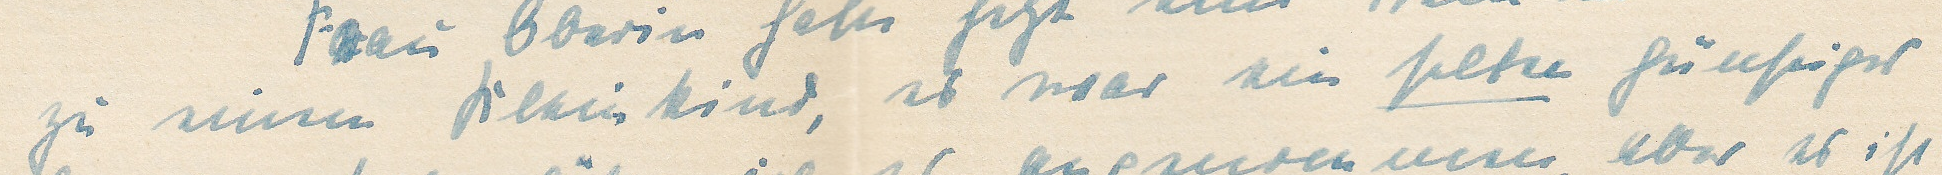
zu einen Kleinkind, es war ein selten häufiges
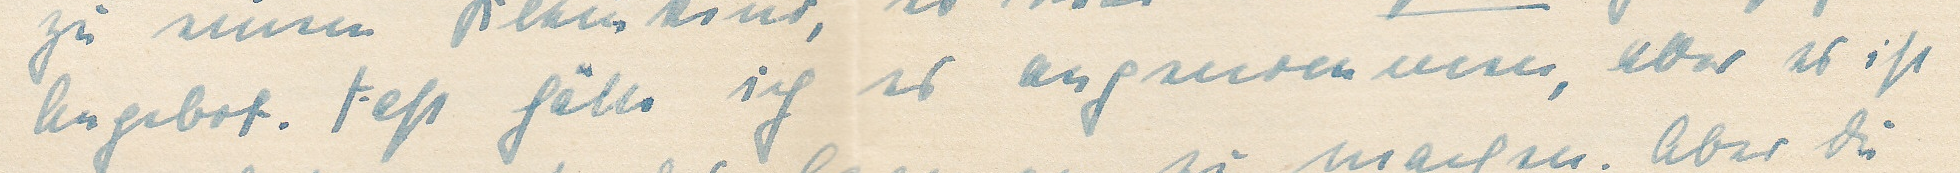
Angebot. Fast hätte ich es angenommen, aber es ist
